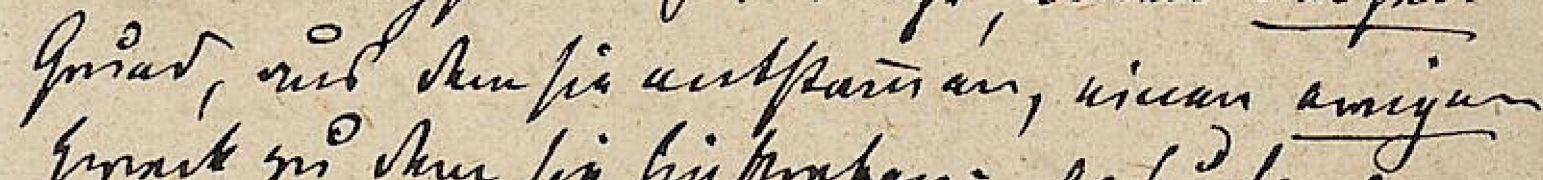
Grund, aus dem sie entstamen, einen ewigen
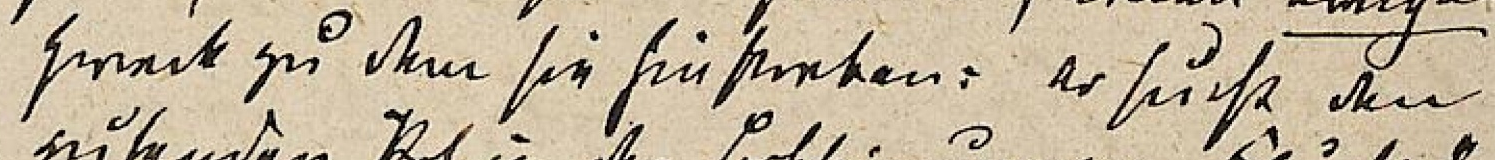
Zweck zu dem sie hinstreben: er sucht den
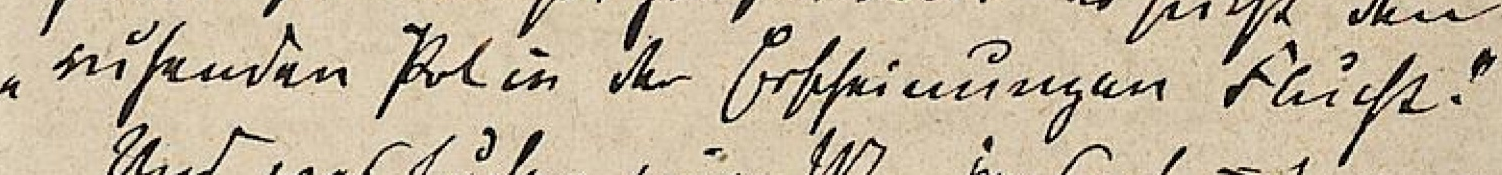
"ruhenden Pol in der Erscheinungen Flucht!"
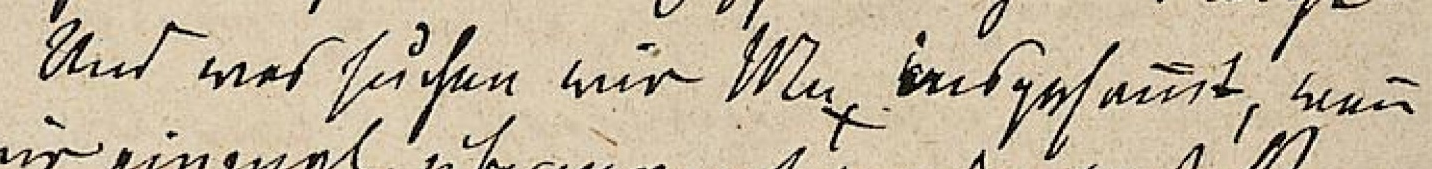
Und was suchen wir Mn insgesamt, wen
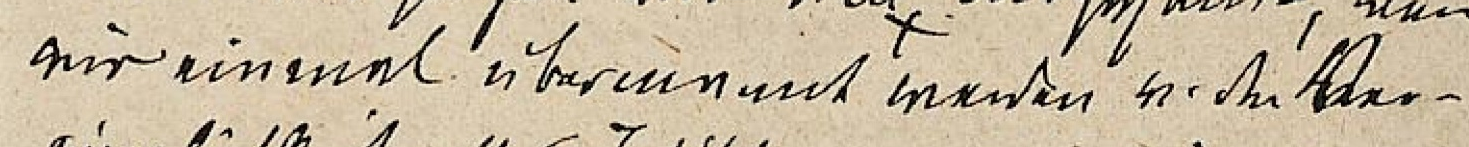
wir einmal übermamnt werden v. dr Ver¬
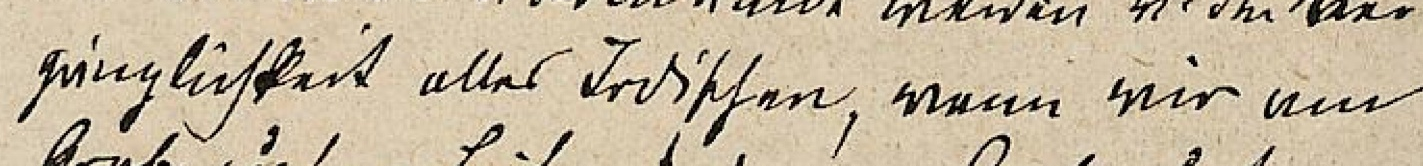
gänglichkeit alles Irdischen, wenn wir am
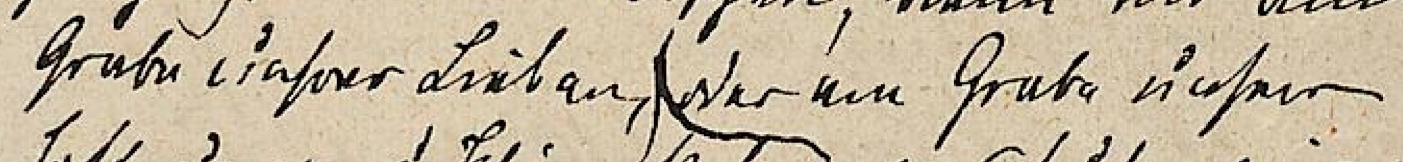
Grabe unsrer Lieben, oder am Grabe unser
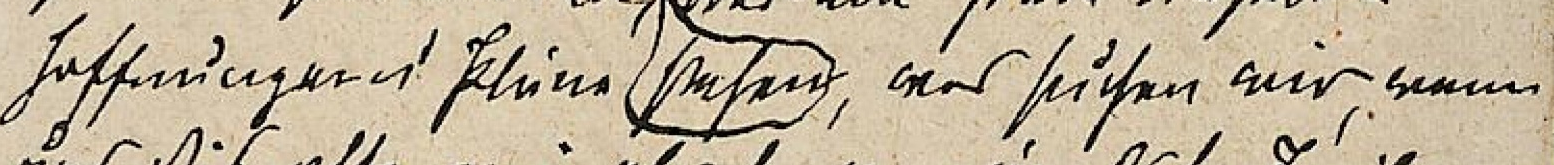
Hoffnungen u Pläne stehen, was suchen wir, wenn
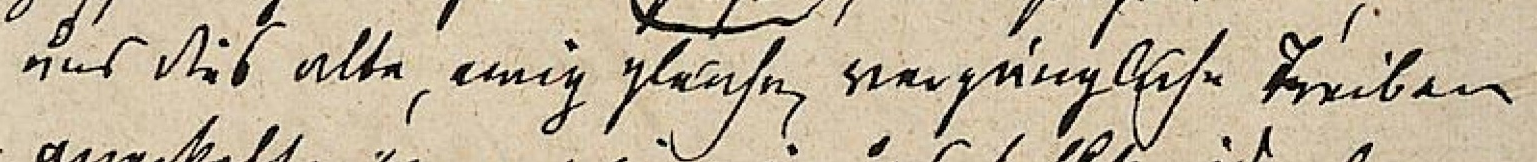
uns dies alte, weig gleich, vergängliche Treiben
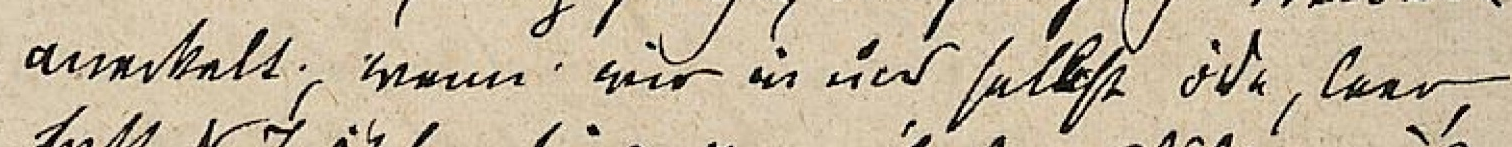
anekelt, wenn wir in uns selbst öde, leer
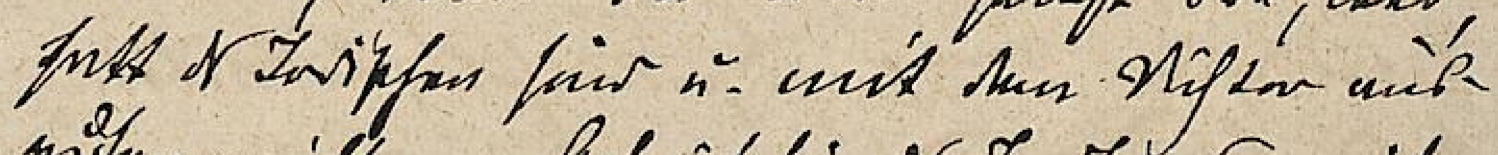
satt ds Irdischen sind u. mit dem Dichter aus¬
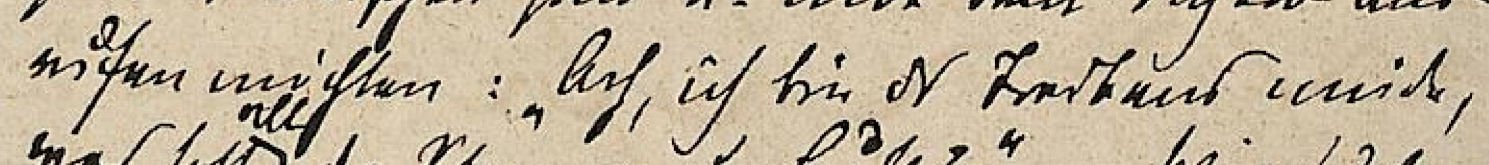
rufen möchten: "Ach, ich bin ds Treibens müde,
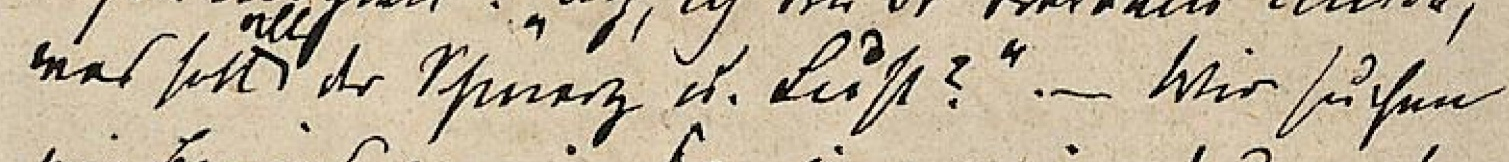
was soll der Schmerz u. Lust?" _ Wir suchen
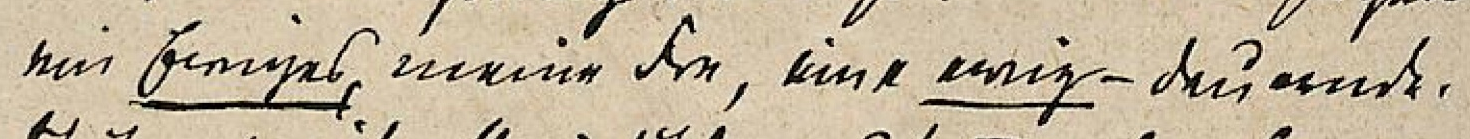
ein Ewiges, meine Frn, ein ewig-dauernde.
